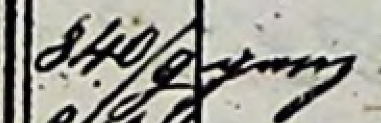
840/g ganz
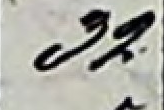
32
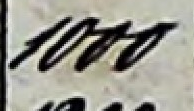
1000
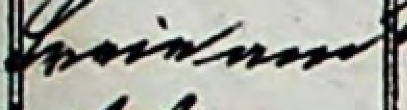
Svein am
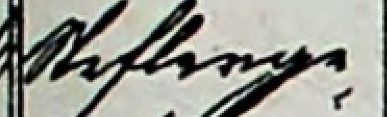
Steflerge„
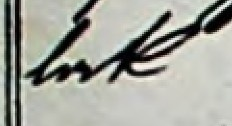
lak
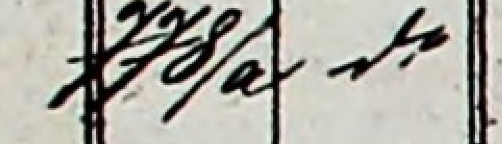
778/a do
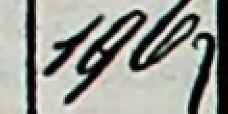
196
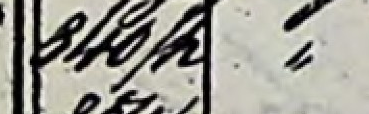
840/h „
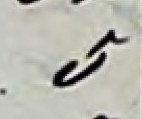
5 1200
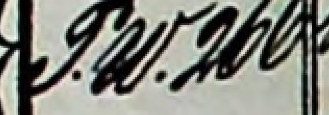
P.W. 266
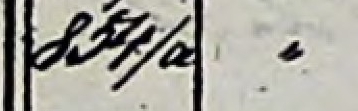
854/a „
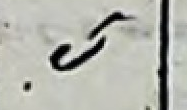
5 23
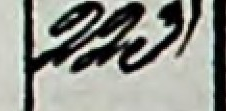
223
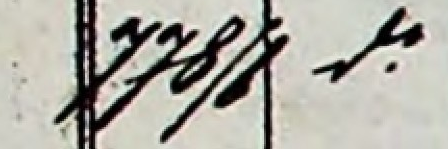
778/b do
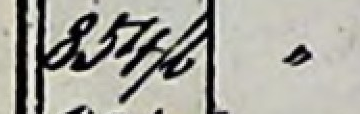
854/b „
